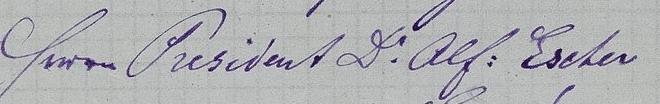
Herrn President Dr Alf: Escher
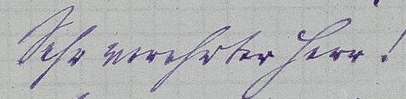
Sehr verehrter Herr!
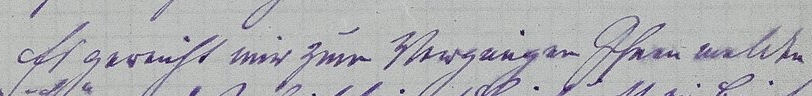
Es gereicht mir zum Vergnügen Ihnen melden
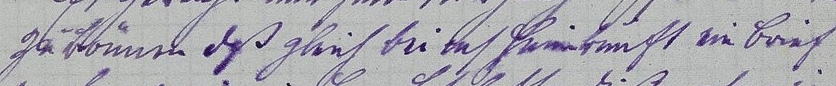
zu können daß gleich bei meiner Heimkunft ein Brief
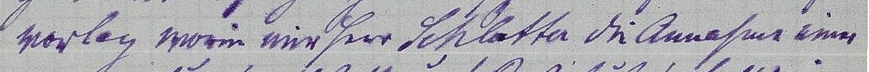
vorlag worin mir Herr Schlatter die Annahme einer
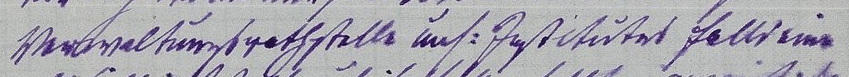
Verwaltungsrathstelle unseres: Institutes falls eine
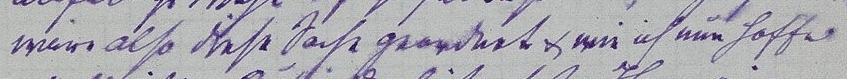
wäre also diese Sache geordnet & wie ich nun hoffe
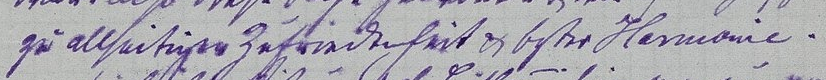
zu allseitiger Zufriedenheit & bester Harmonie.
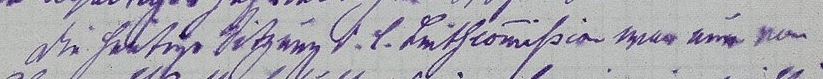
Die heutige Sitzung d. l. Linthcommission war nur von
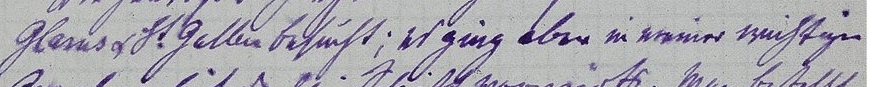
Glarus & St Gallen besucht; es ging aber in meiner wichtigen
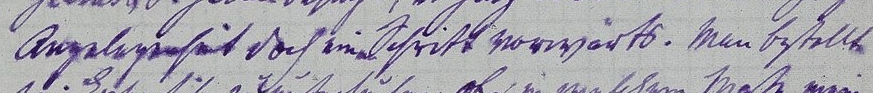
Angelegenheit doch einen Schritt vorwärts. Man bestellte
